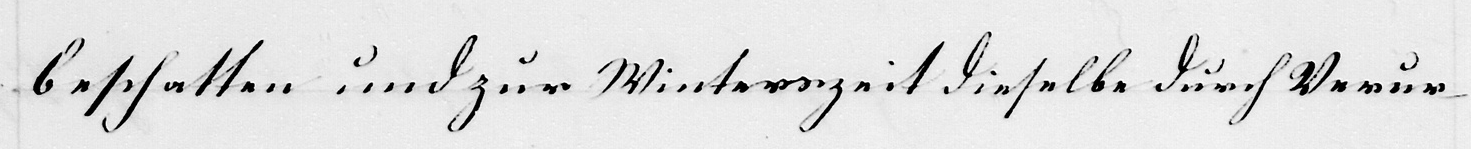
beschatten und zur Winterszeit dieselbe durch Verur¬
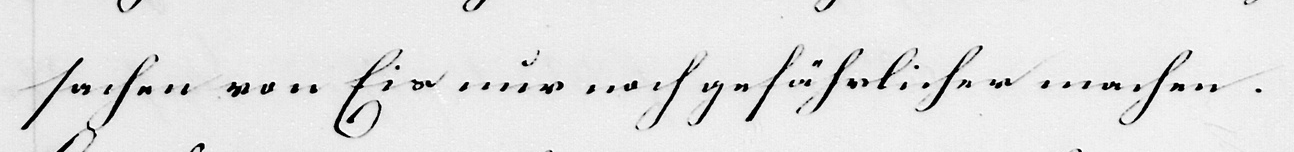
sachen von Eis nur noch gefährlicher machen.
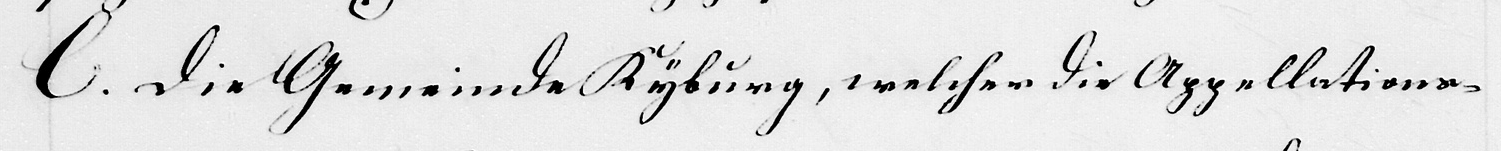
C. Die Gemeinde Kyburg, welcher die Appellations¬
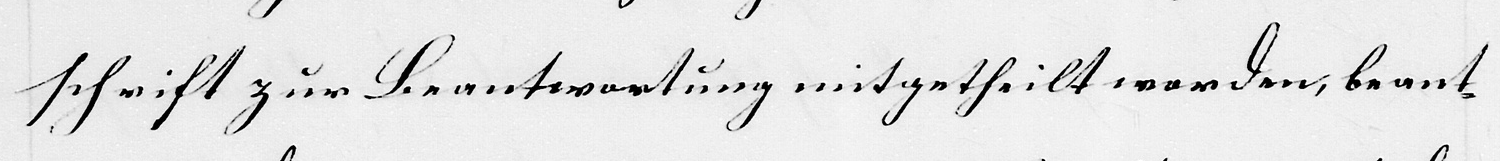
schrift zur Beantwortung mitgetheilt worden, beant¬
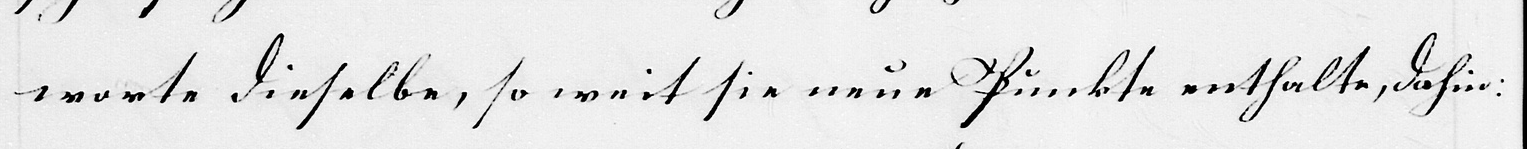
worte dieselbe, so weit sie neue Punkte enthalte, dahin:
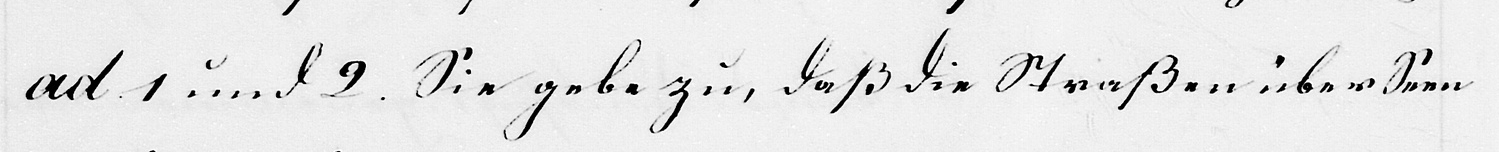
ad. 1 und 2. Sie gebe zu, daß die Straßen über Seen
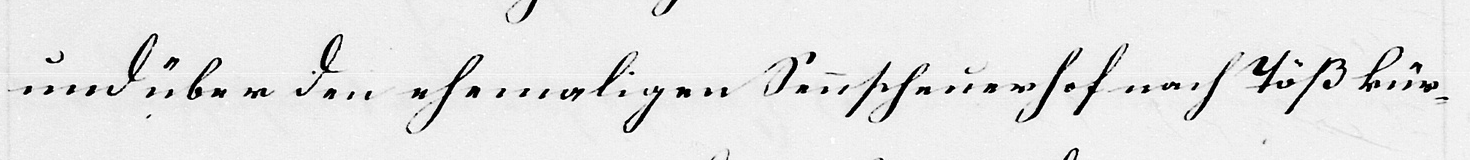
und über den ehemaligen Sennscheuerhof nach Töß kür¬
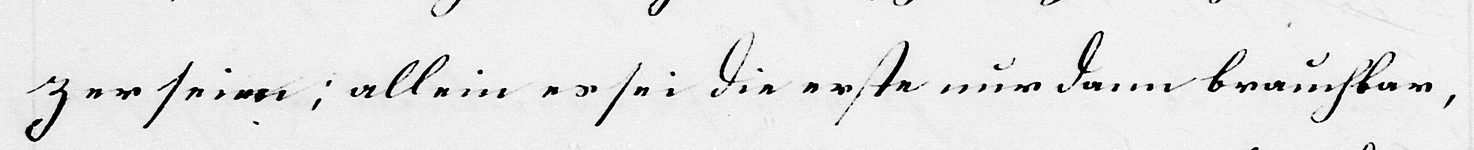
zer seien; allein es sei die erste nur dann brauchbar,
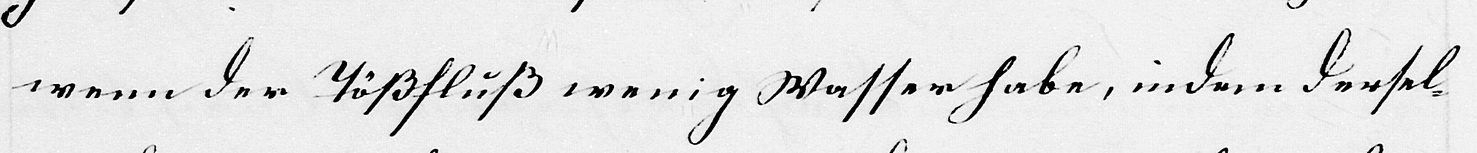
wenn der Tößfluß wenig Wasser habe, indem dersel¬
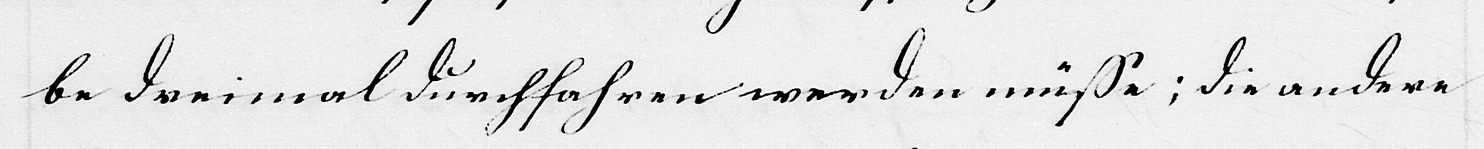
be dreimal durchfahren werden müße; die andere
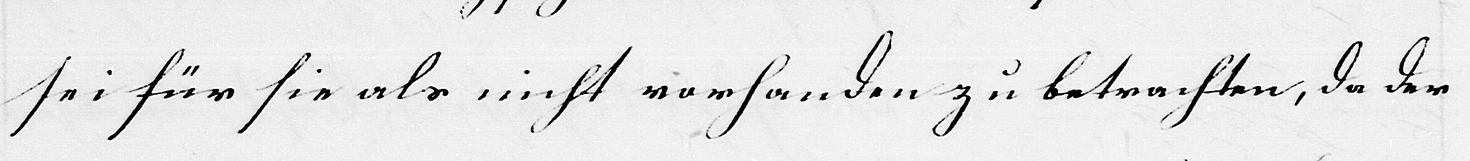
sei für sie als nicht vorhanden zu betrachten, da der
